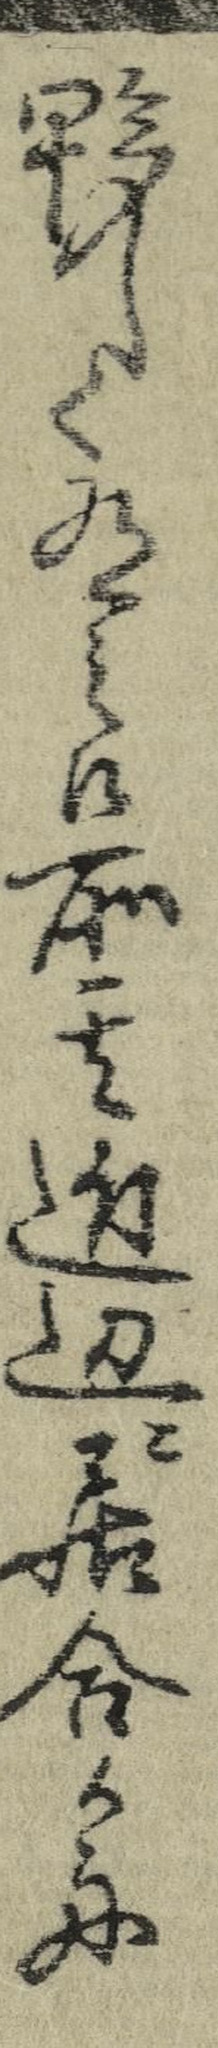夥しく有之候所其近辺に居合か舟
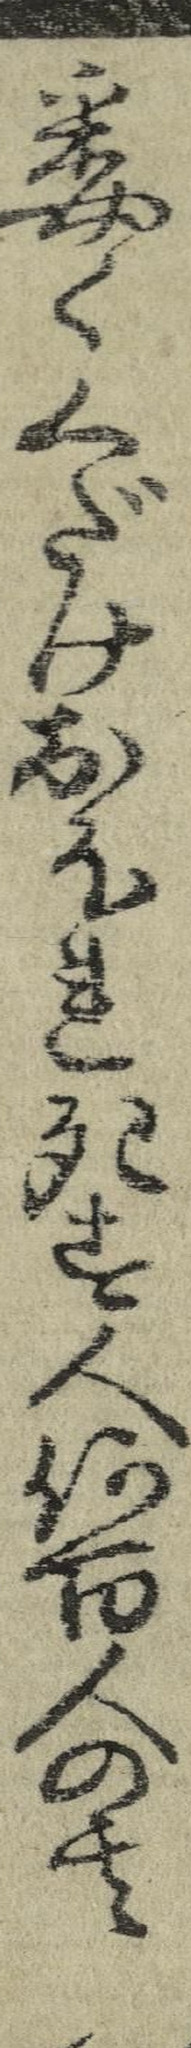悉くくだけおほれ死す人何百人の其
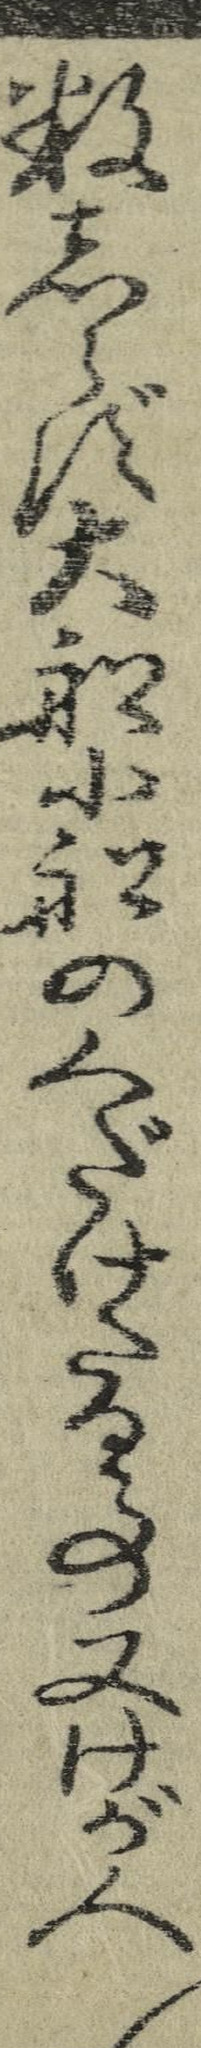数しらず大船小船のくだけたる事又けが人
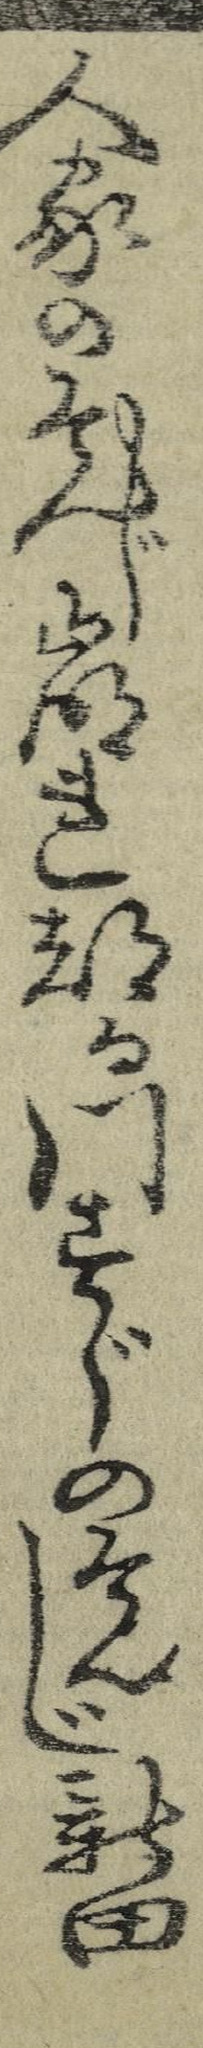人家のそんじ崩れ都る川すじのそんじ新田
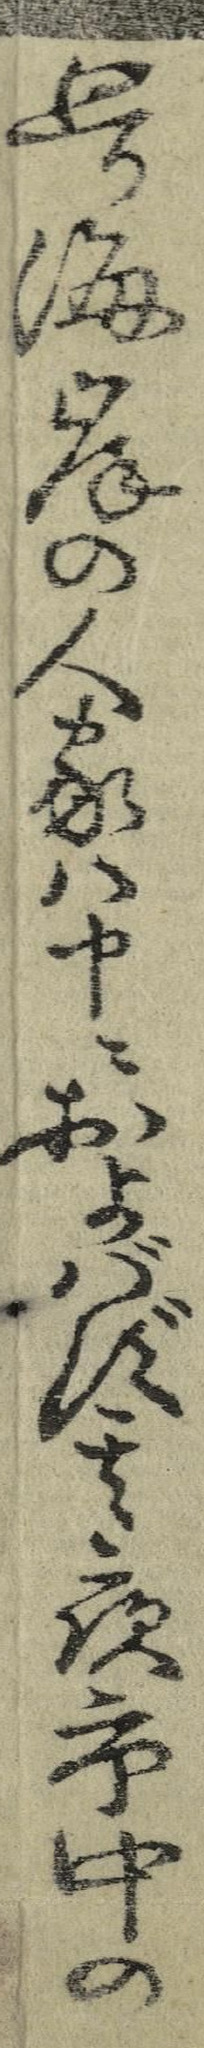廻り海岸の人家は申におよばず其夜市中の
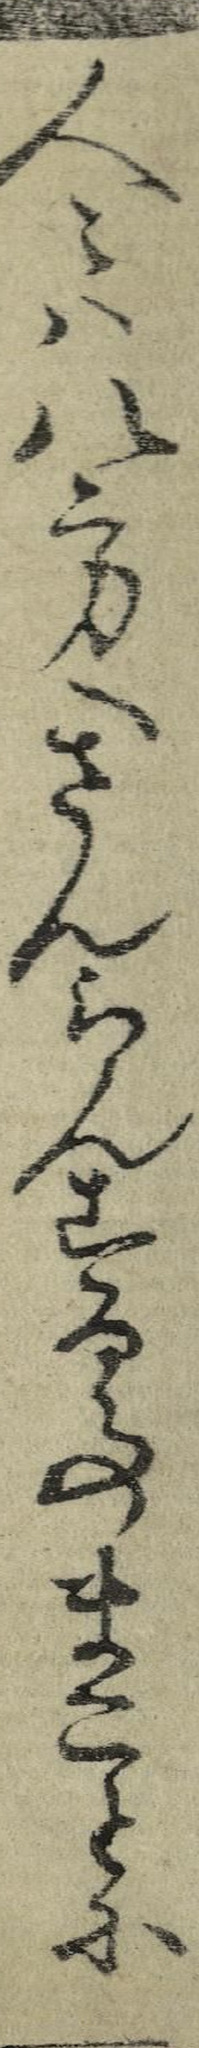人〻は八方へさんらんする事まことに
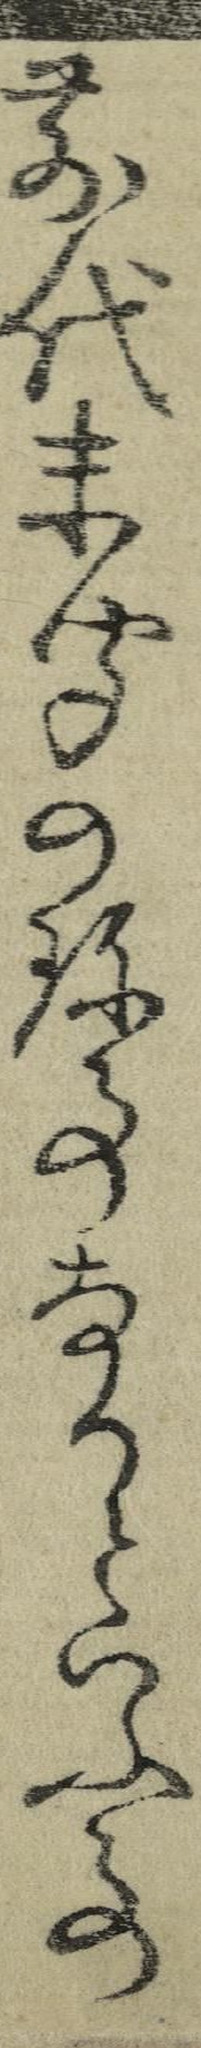前代未聞の珍事なりといふ事
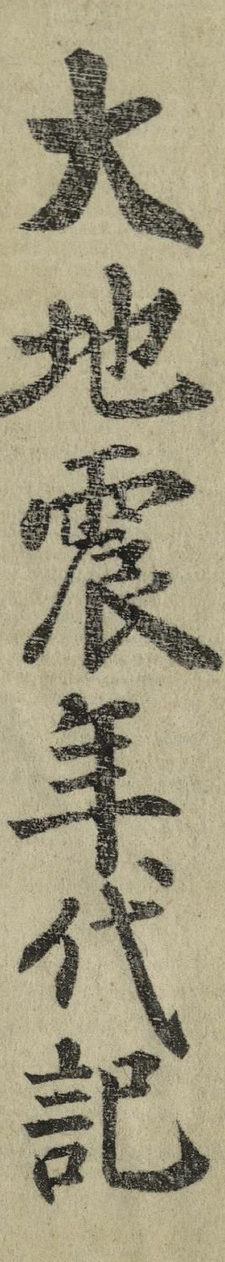大地震年代記
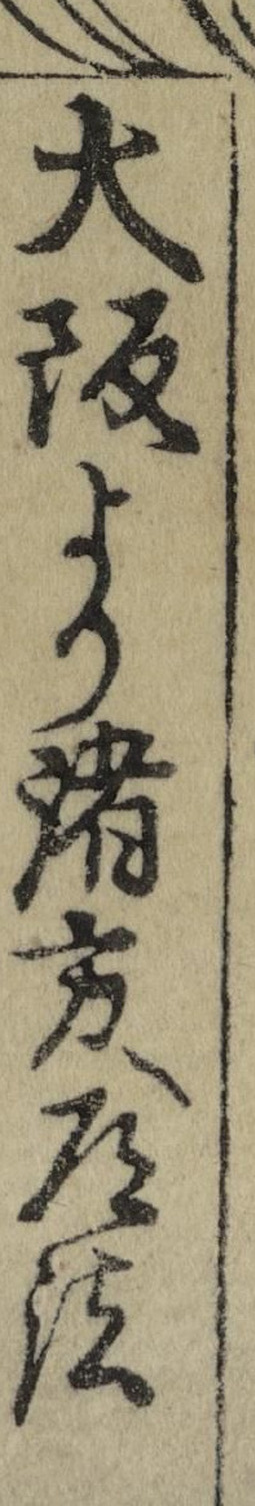大坂より諸方へ道法
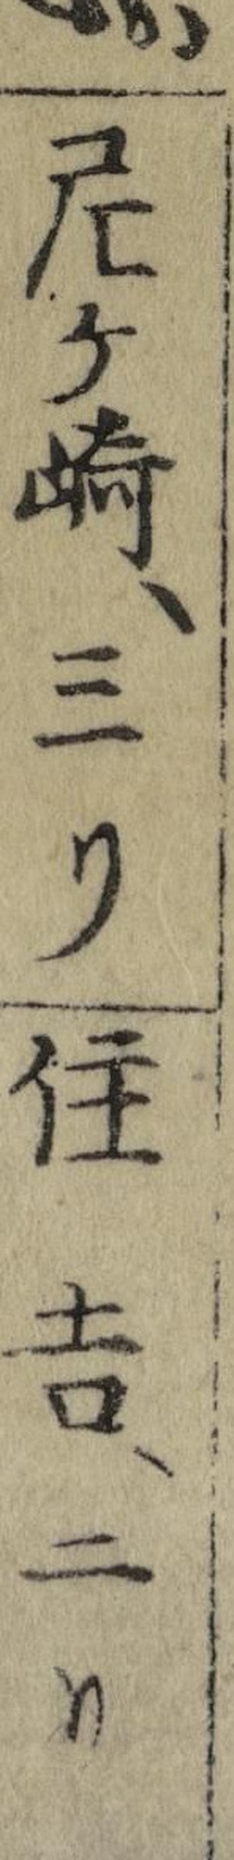尼ケ崎、三リ住吉、二り
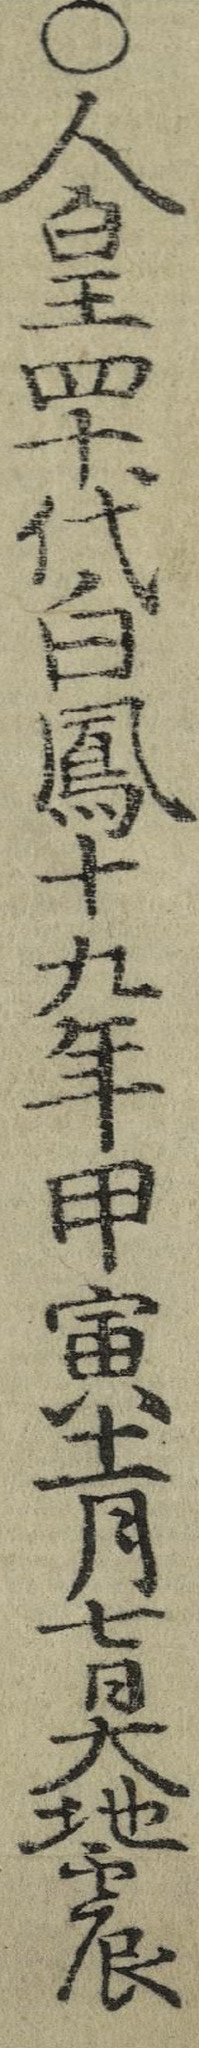〇人皇四十代白鳳十九年甲寅十一月七日大地震
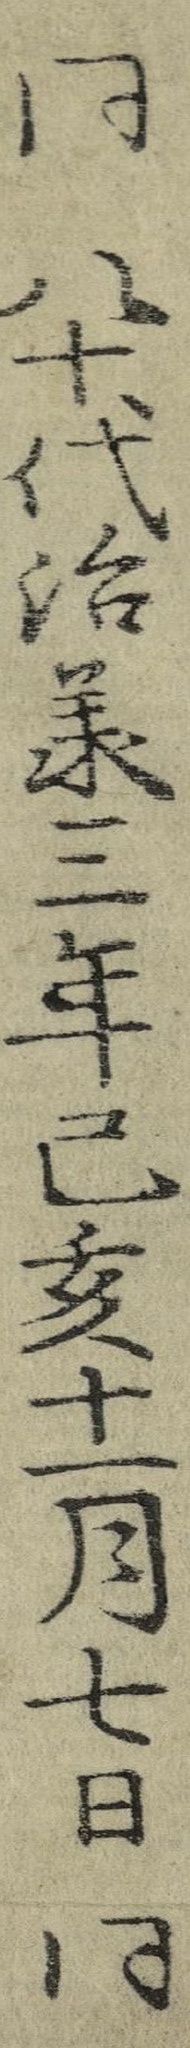同八十代治承三年已亥十一月七日同
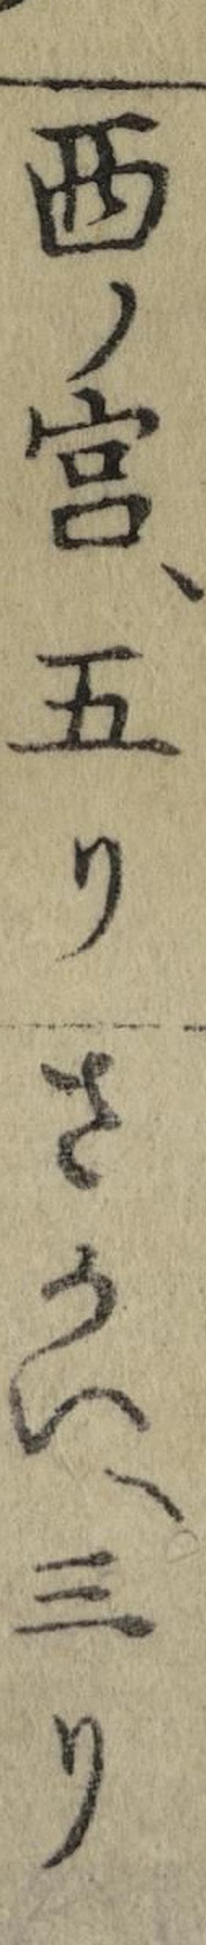西ノ宮、五リさかい、三リ
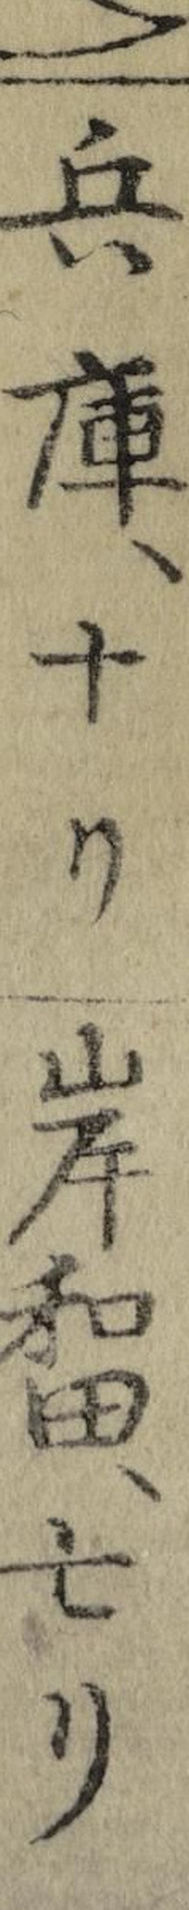兵庫、十リ岸和田、七リ
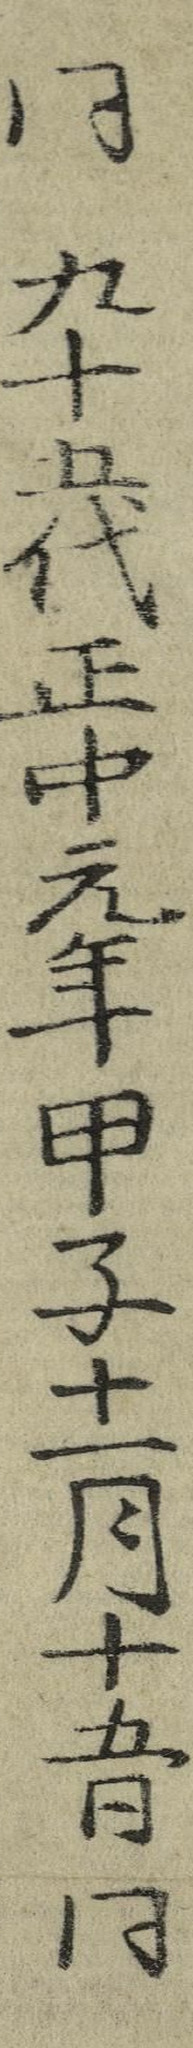同九十五代正中元年甲子十一月十五日同
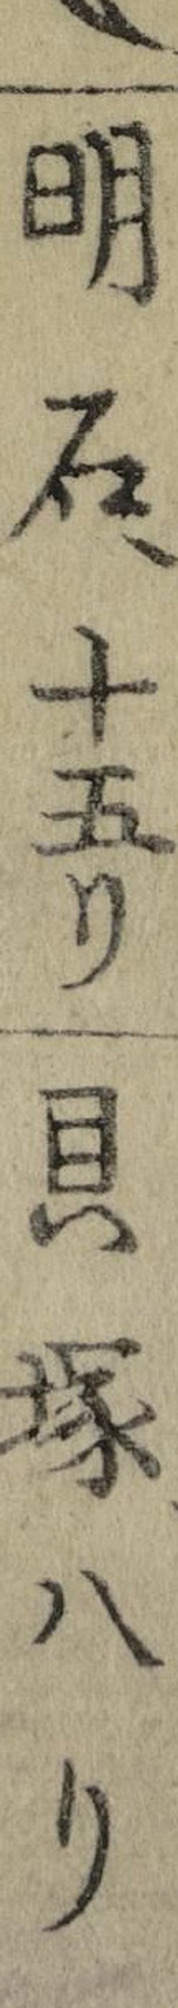明石、十五リ貝塚、八リ
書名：摂津大阪近辺早引方角附　大地震ニ附大津波次第
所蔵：東京大学地震研究所図書室 Earthquake Research Institute Library, The University of Tokyo, JAPAN
